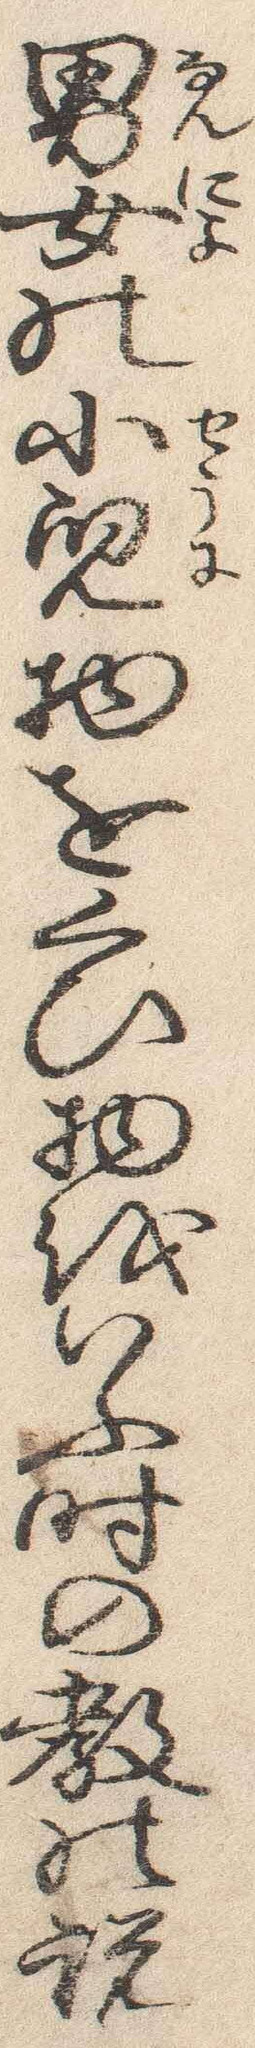㊂男女の小児物をくひ物をいふ時の教の説
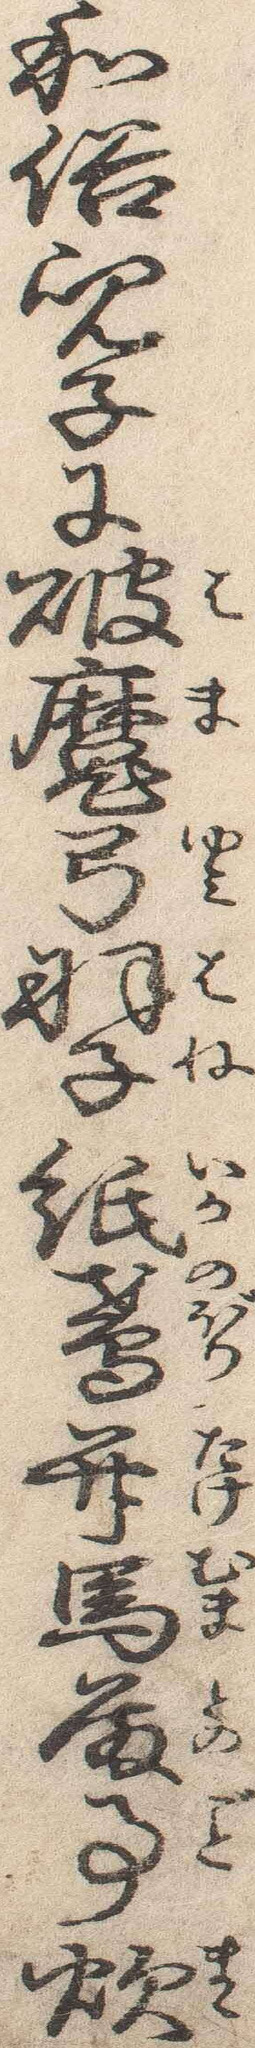㊃和俗児子に破魔弓羽子紙鳶竹馬殿事炊
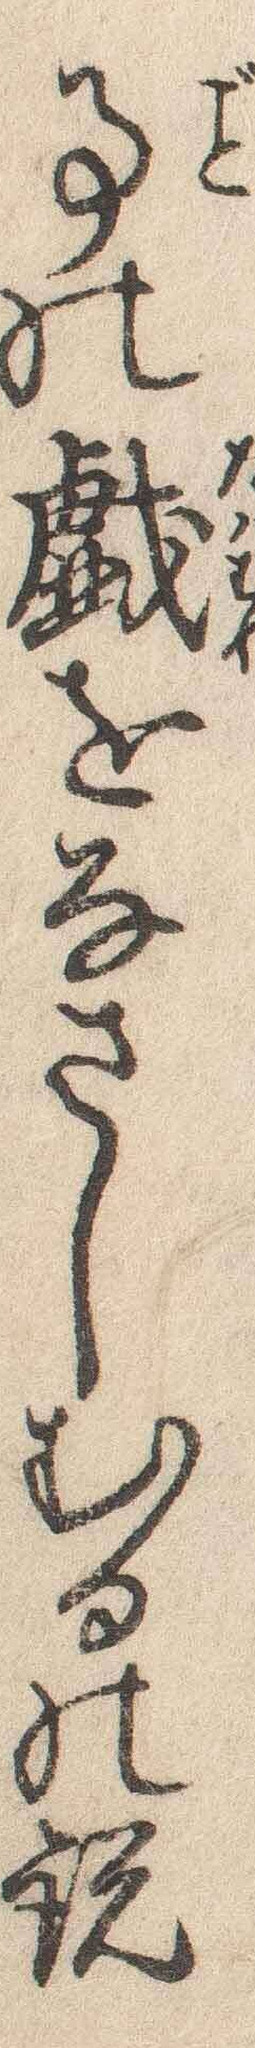事の戯をなさしむるの説
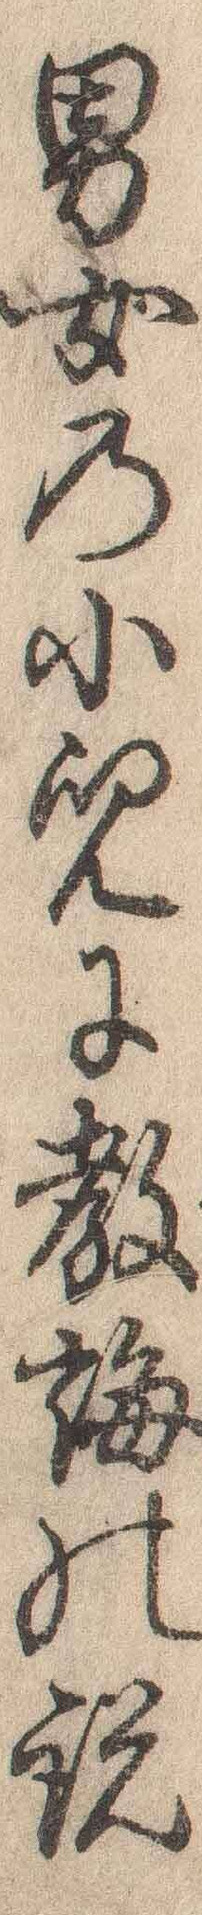㊄男女の小児に教誨の説

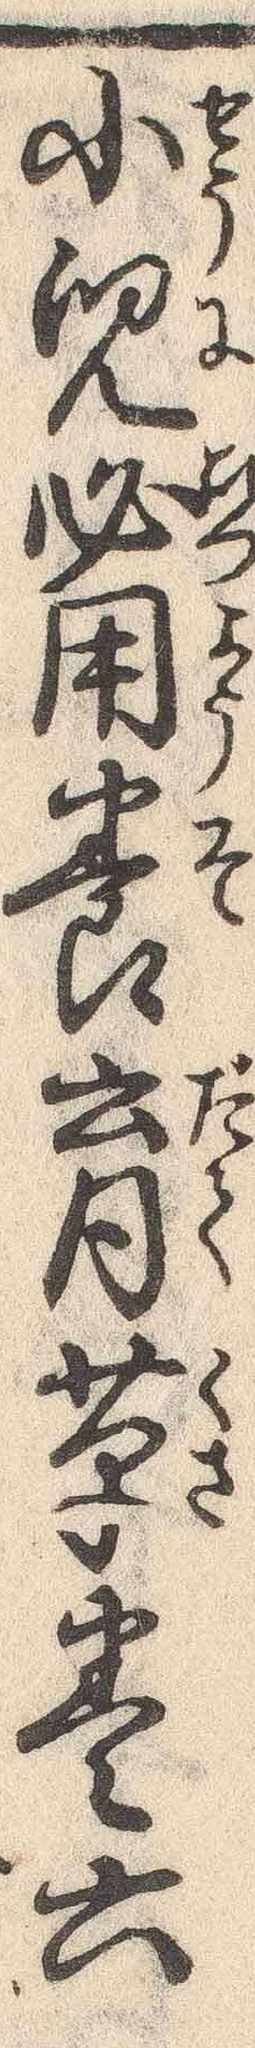小児必用養育草巻六
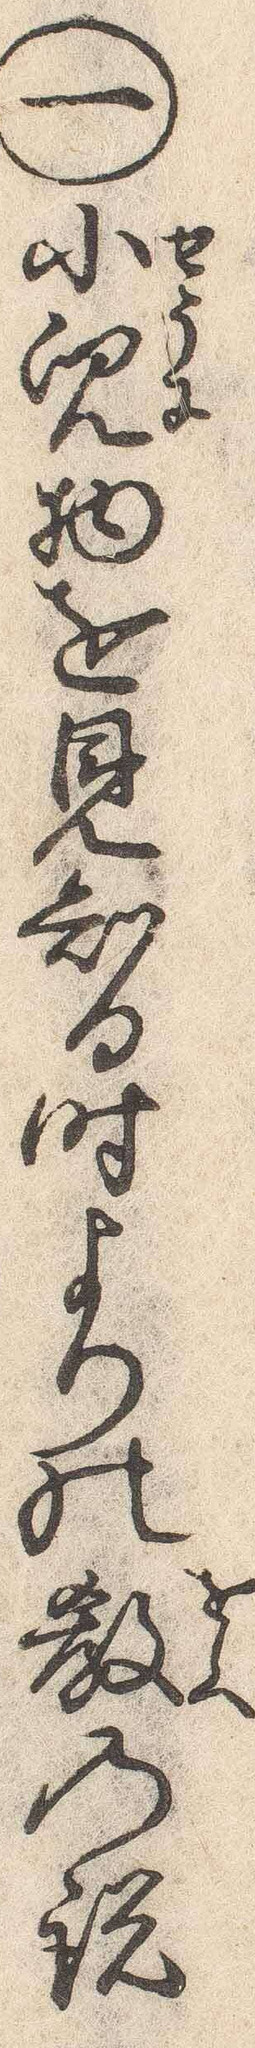㊀小児物を見知る時よりの教の説
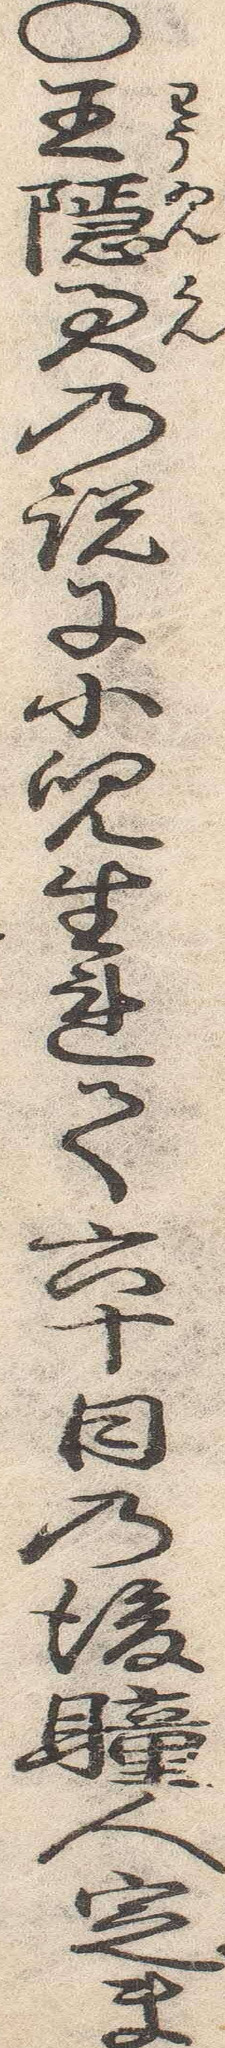○王隠君の説に小児生れて六十日の後瞳人定ま
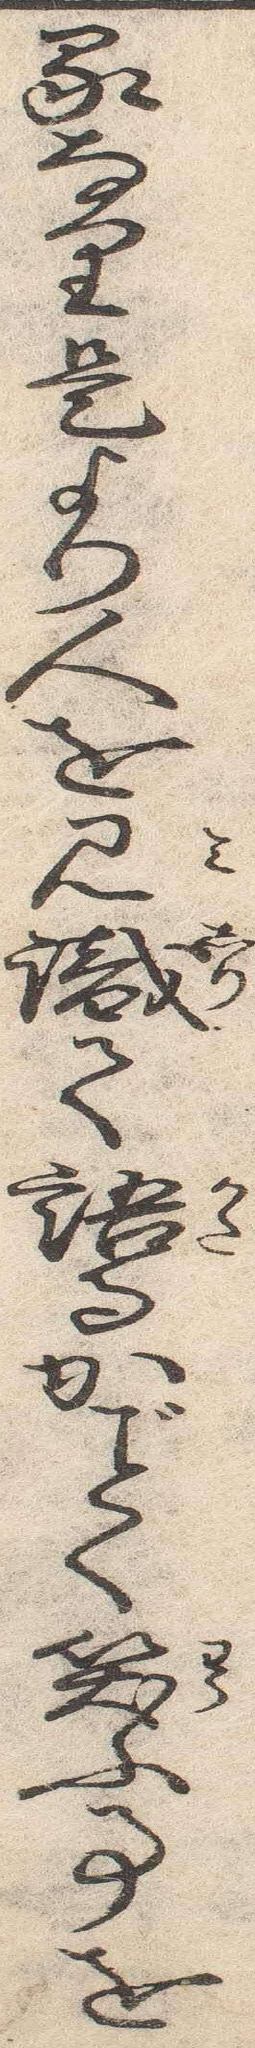るなり是より人を見識て語るかごとく笑ふ事を
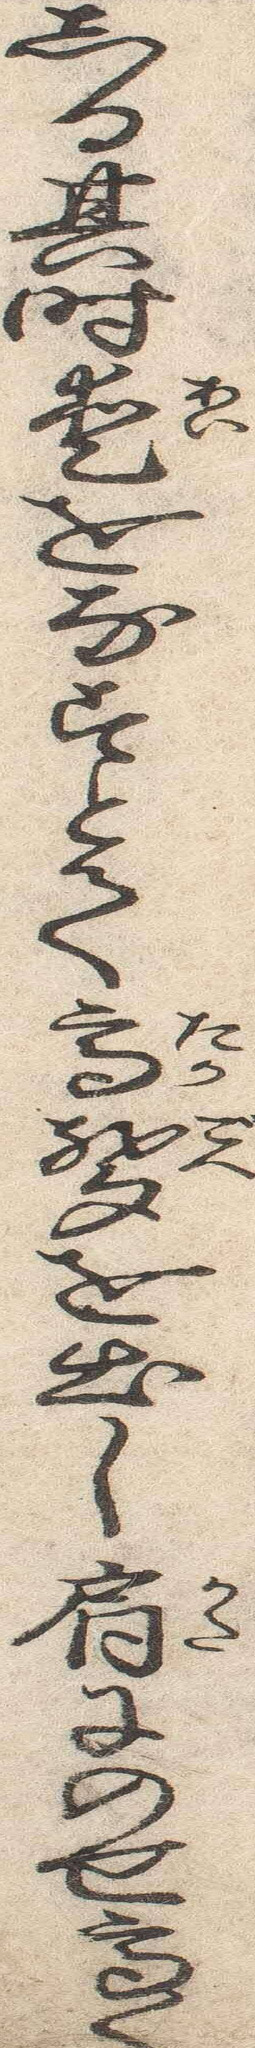しる其時愛をなすとて高声を出し肩にのせ高く
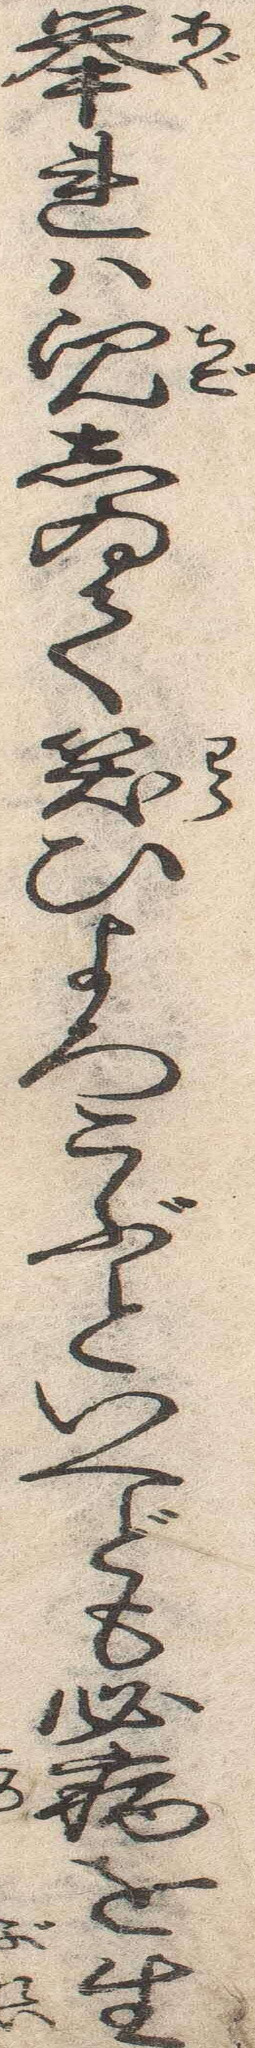挙れは児しゐて笑ひよろこぶといへども必病を生
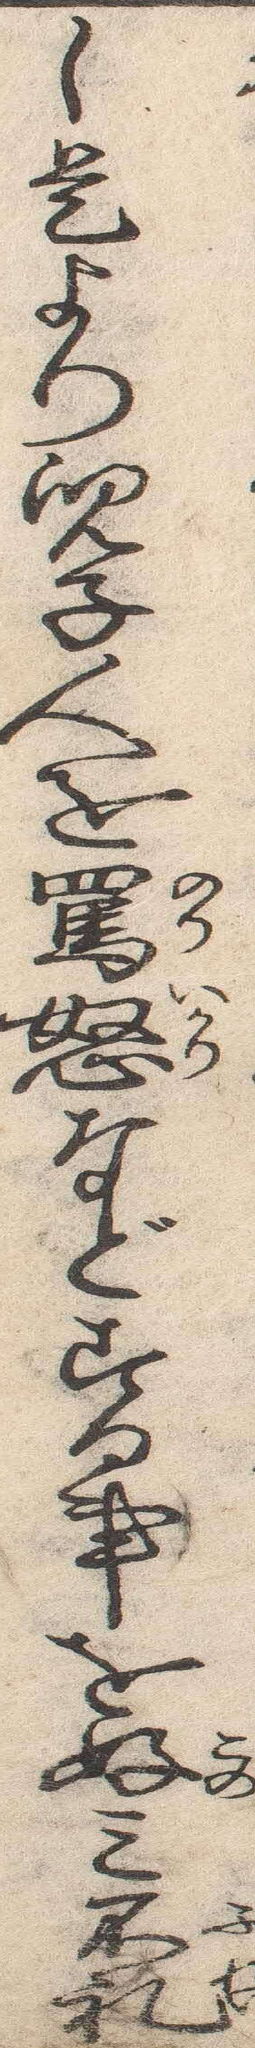し是より児子人を罵怒などする事を好み不礼
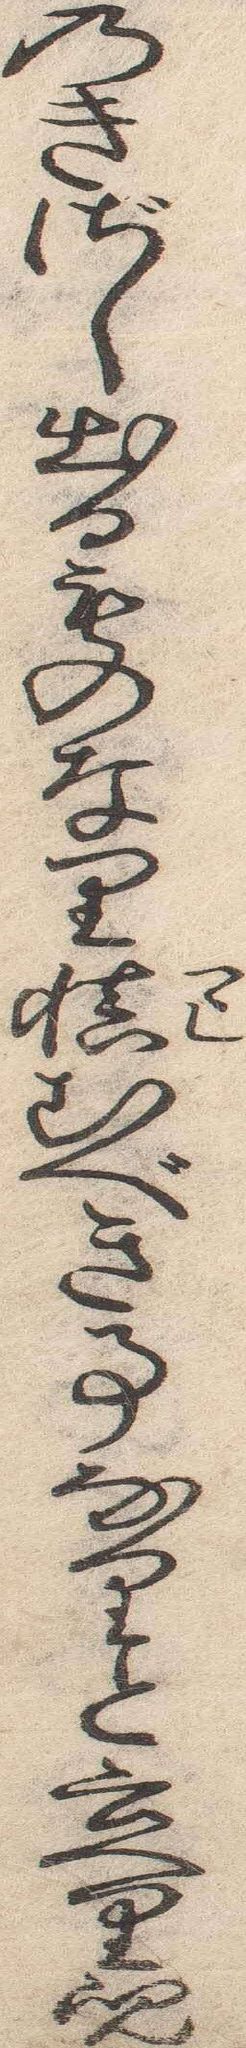のきざし出るものなり慎むべき事なりと云へり児
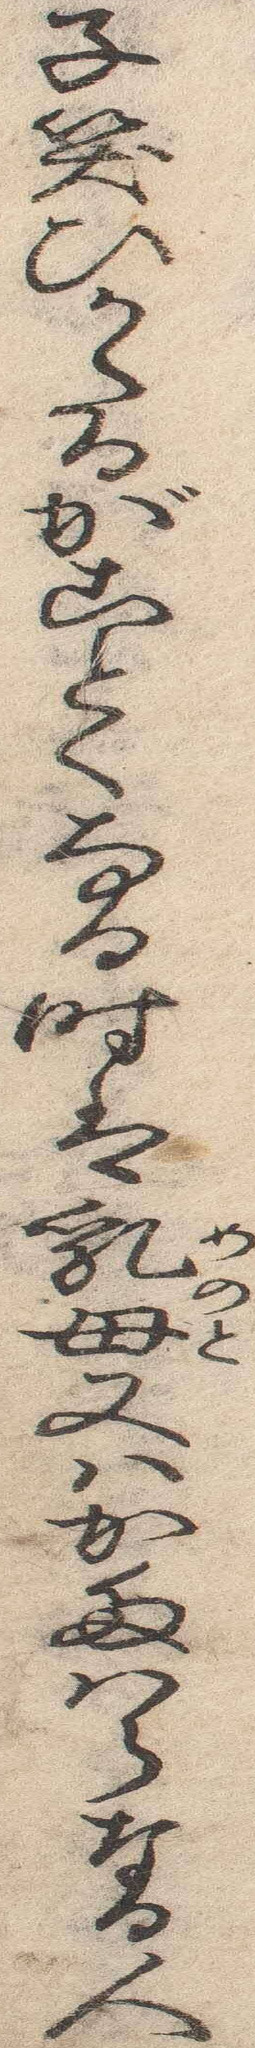子笑ひかたるがことくなる時は乳母又はかたはらなる人

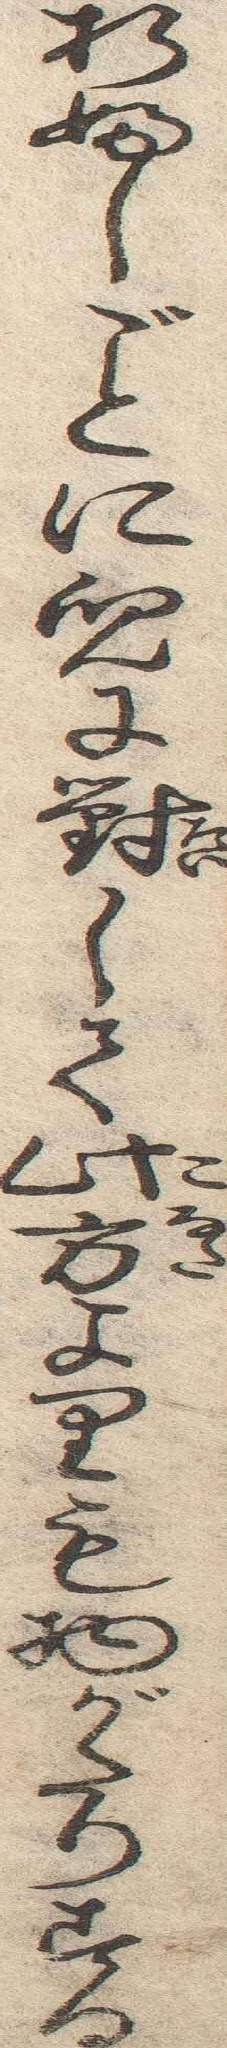折ふしごとに児に対して此方よりも物がたりする
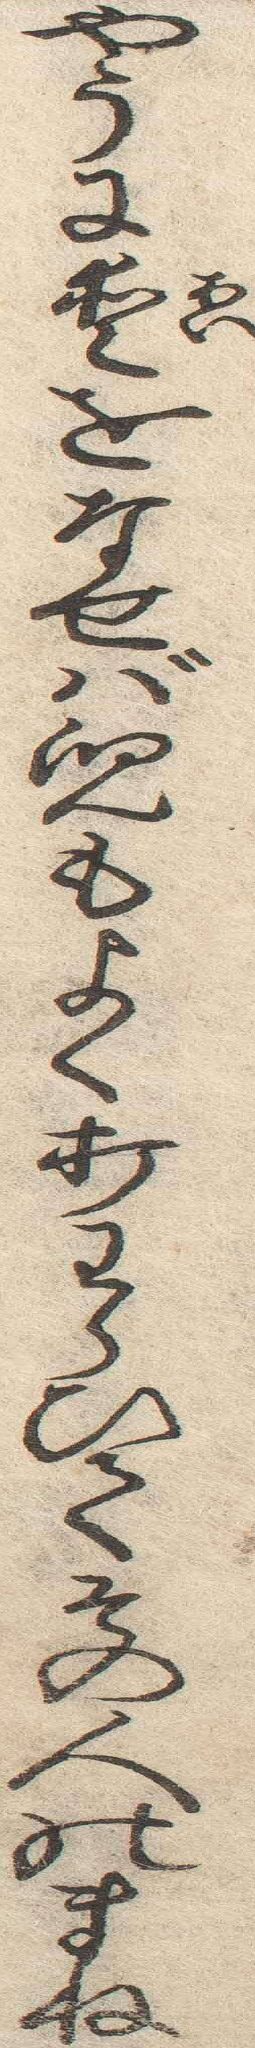やうに愛をなせば児もよく打わらひてその人のまね
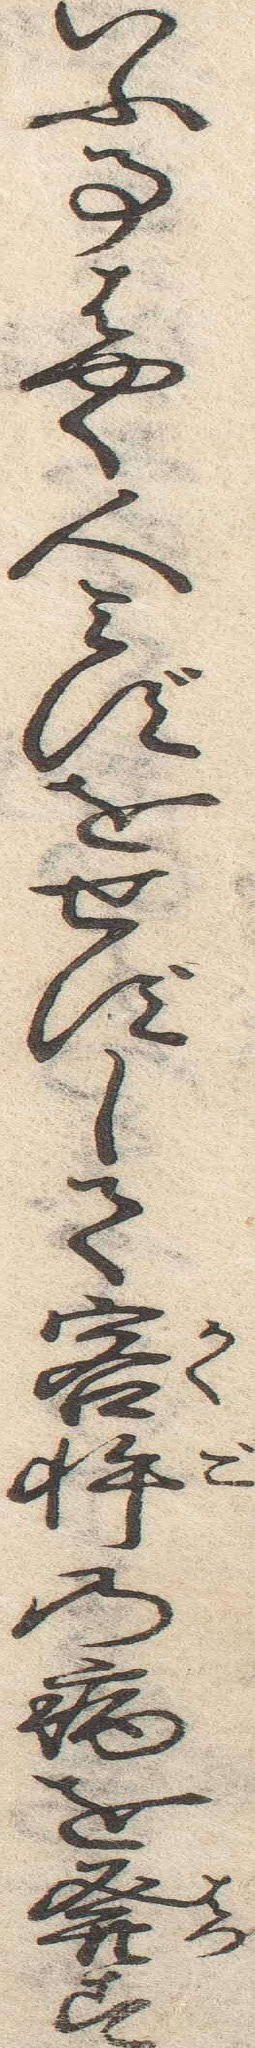いふ事はやく人みずをせずして客忤の病を発す
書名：小児必用養育草
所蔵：東京学芸大学附属図書館 国文学研究資料館
